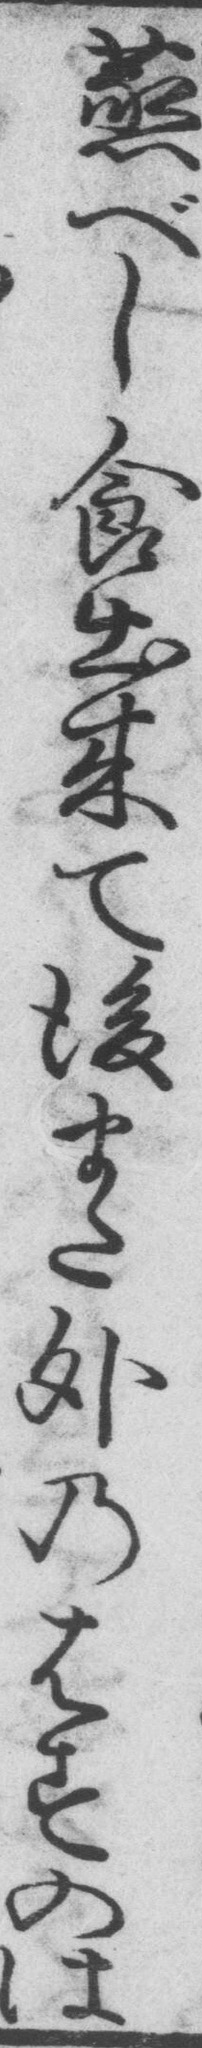蒸べし食出来て後また外乃は春のは
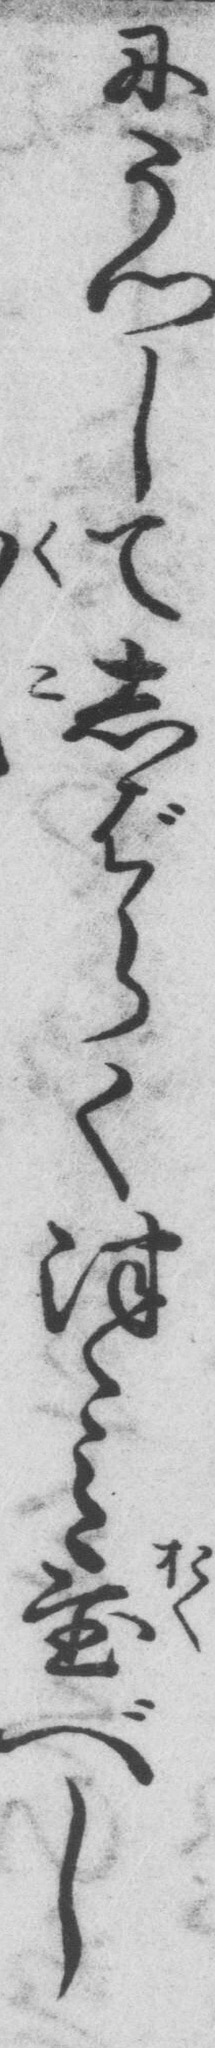丹うつして志ばらく津々み置べし
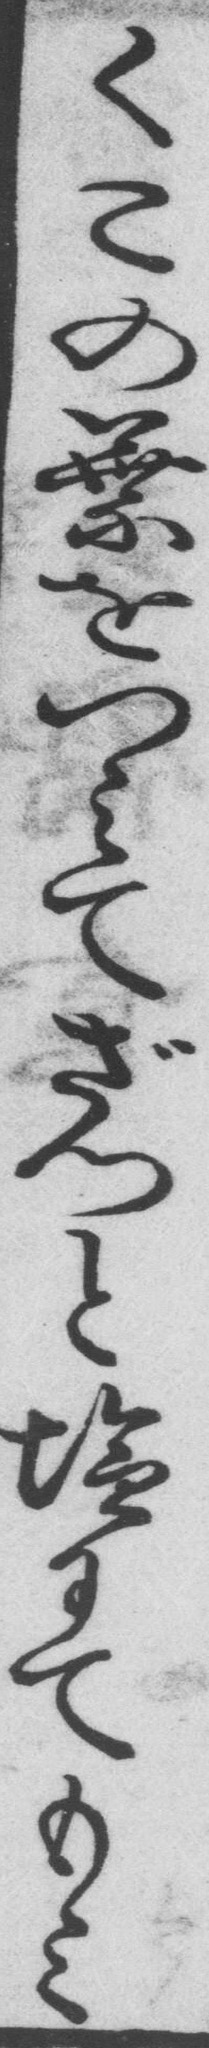くこの葉をつみてざつと塩尓てもみ
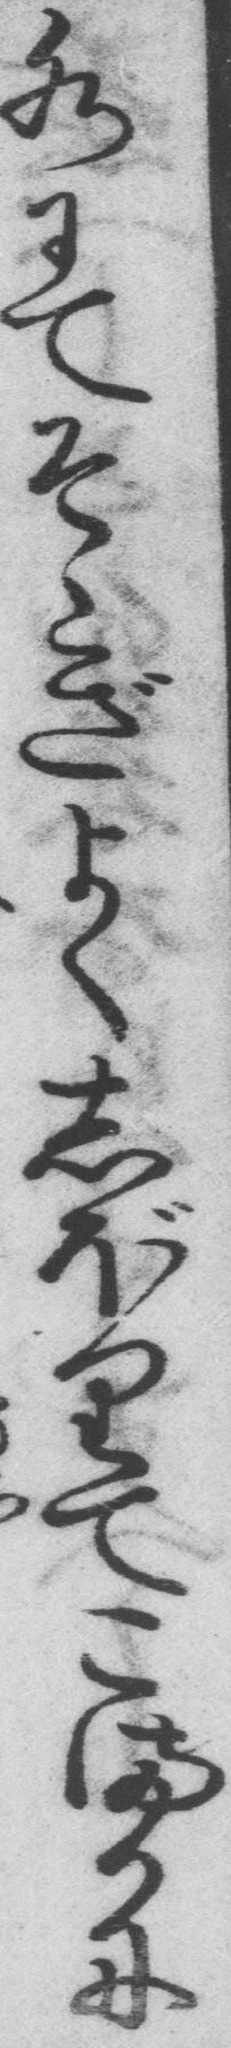水尓てそゝぎよく志ぼ里てこ満か丹
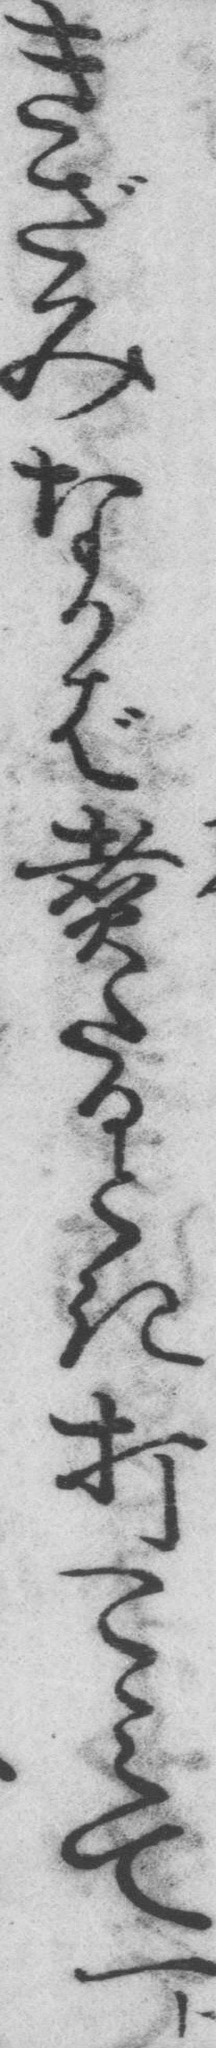きざみなかば煮たると起打こみて一ㇳ
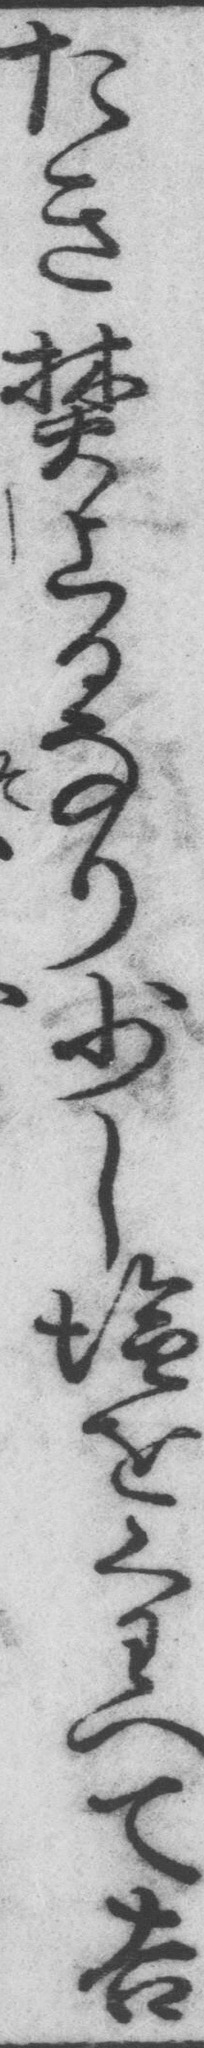たき焚上るなり少し塩をくわへて吉
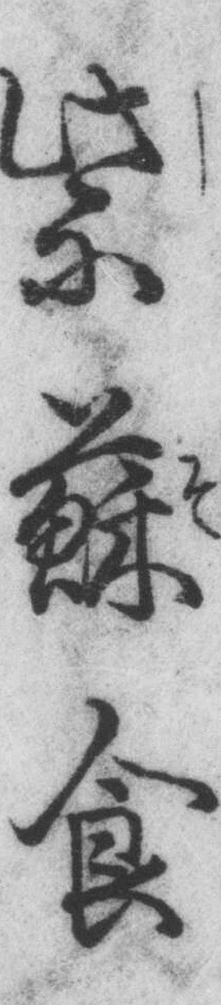紫蘇食
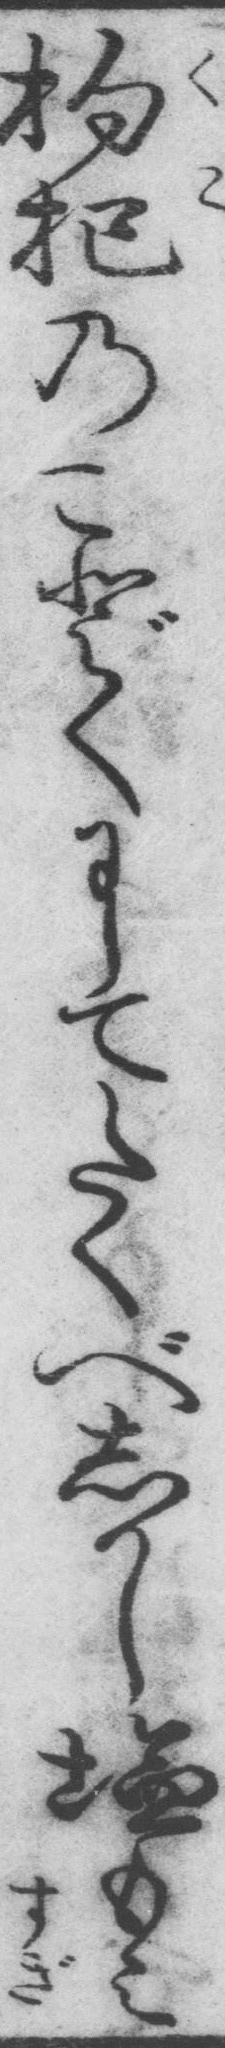枸杞乃ことく尓してたくべ志かし塩もみ
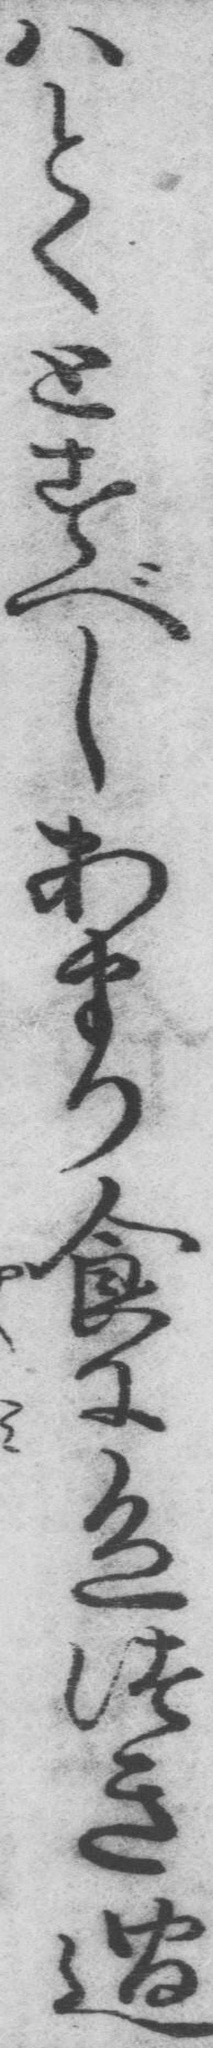はとくと春べしあまり食尓色徒き過
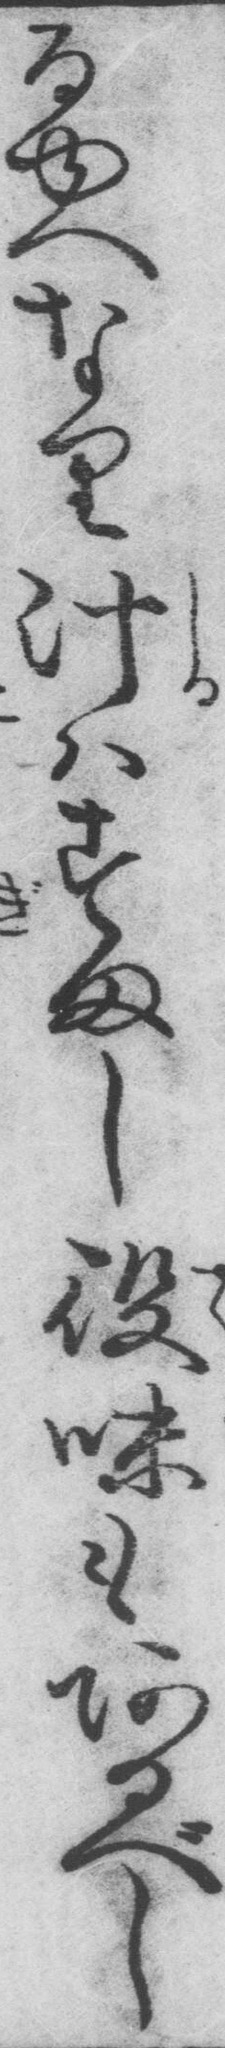るゆへな里汁は春まし役味も阿るべし
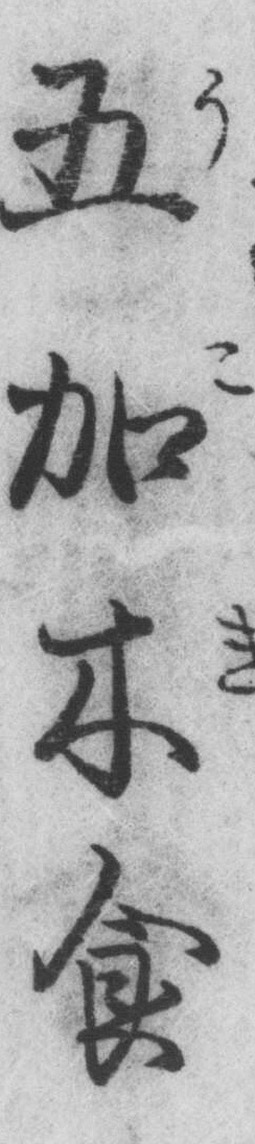五加木食
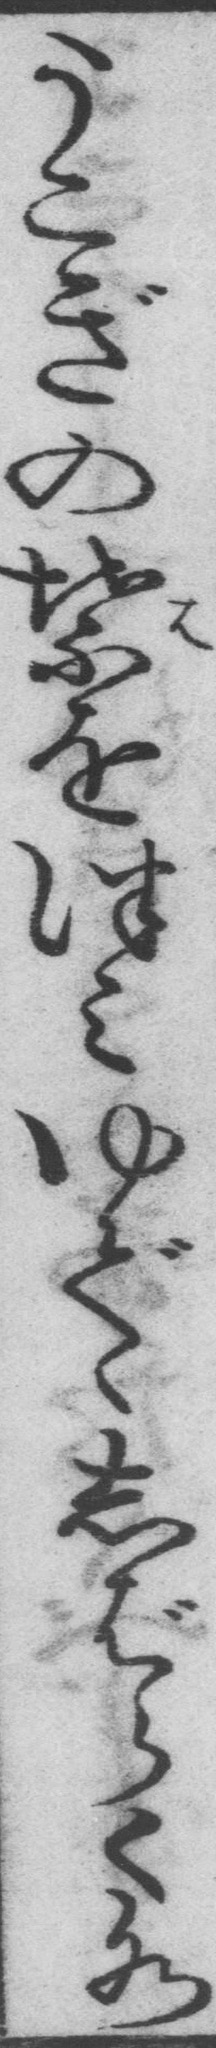うこぎの葉を津みゆでゝ志ばらく水

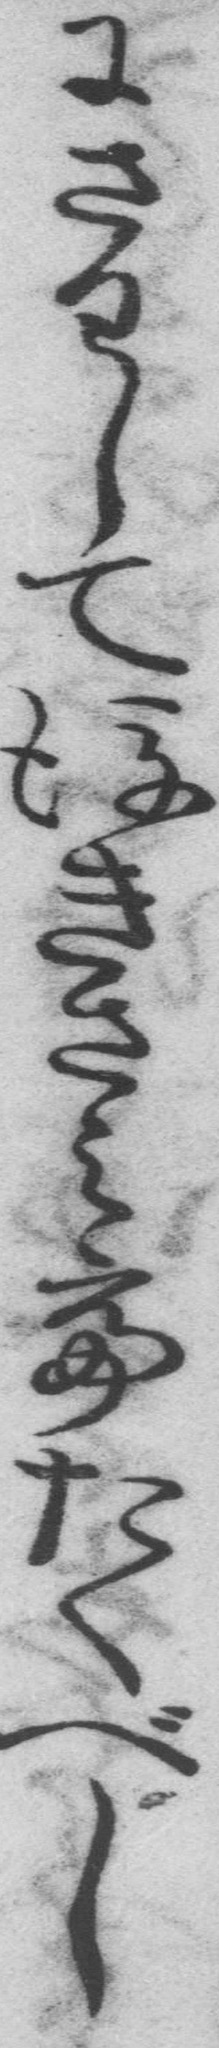尓さわして後きさみ亭たくべし
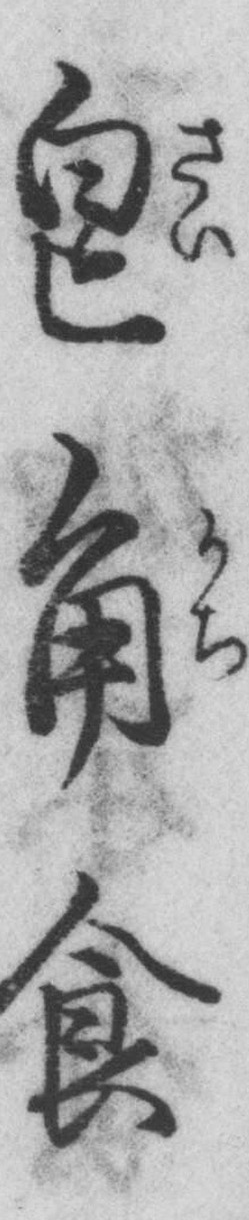皂角食
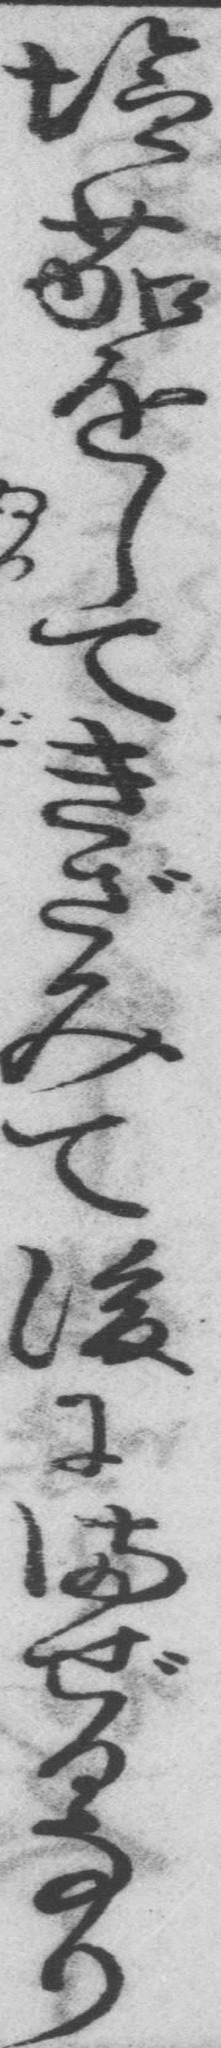塩茹をしてきざみて後尓満ぜるなり
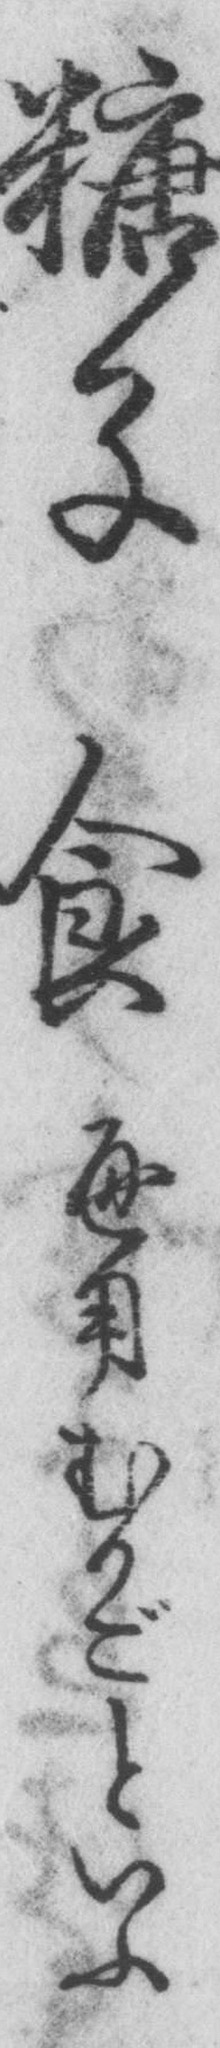糠子食通用むかごといふ
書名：料理伊呂波庖丁
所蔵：大阪府立大学学術情報センター 国文学研究資料館
